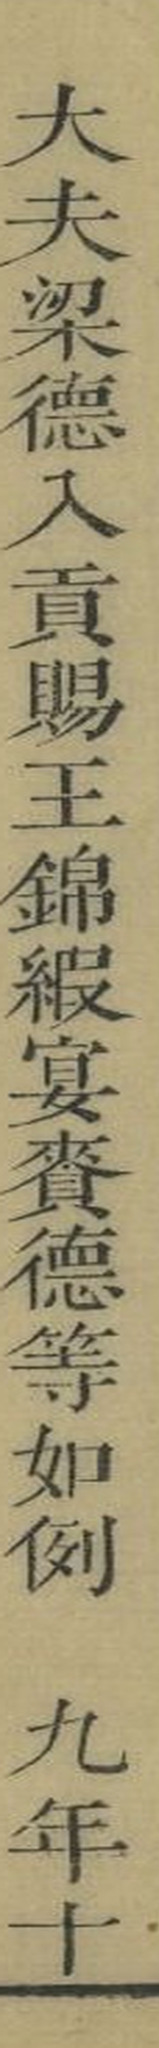大夫梁徳入貢賜王錦緞宴賚徳等如例九年十
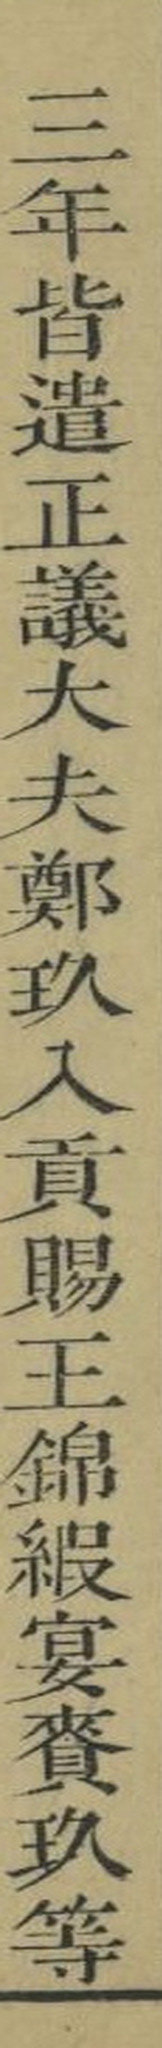三年皆遣正議大夫鄭玖入貢賜王錦緞宴賚玖等
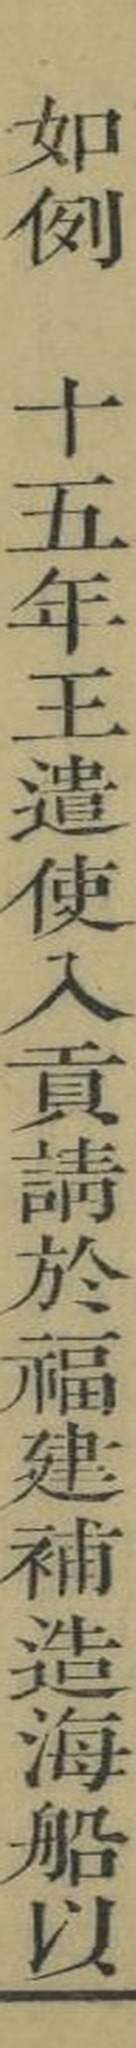如例十五年王遣使入貢請於福建補造海船以
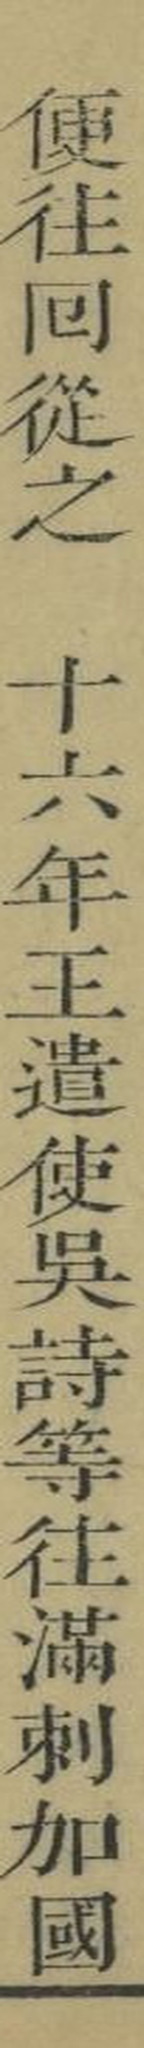便往回従之十六年王遣使呉詩等往満刺加国
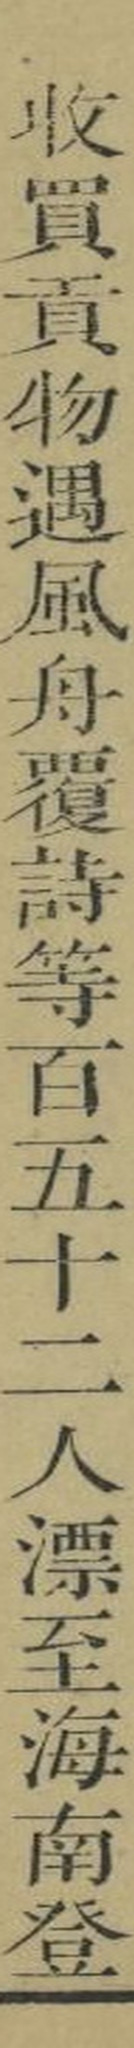収買貢物遇風舟覆詩等百五十二人漂至海南登
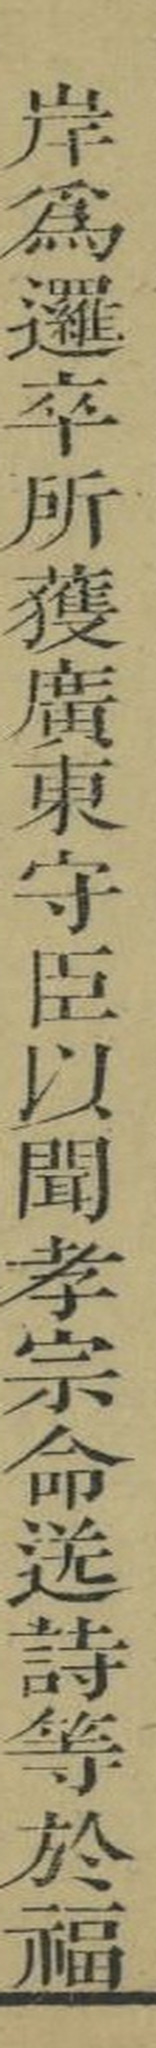岸為邏卒所獲広東守臣以聞孝宗命送詩等於福
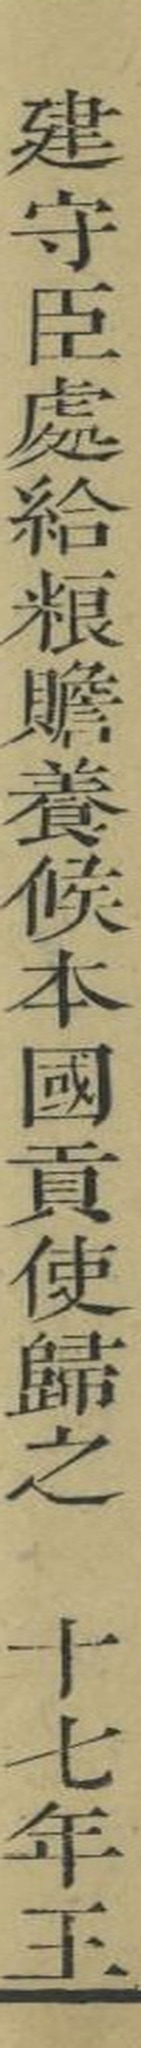建守臣処給粮贍養候本国貢使帰之十七年王
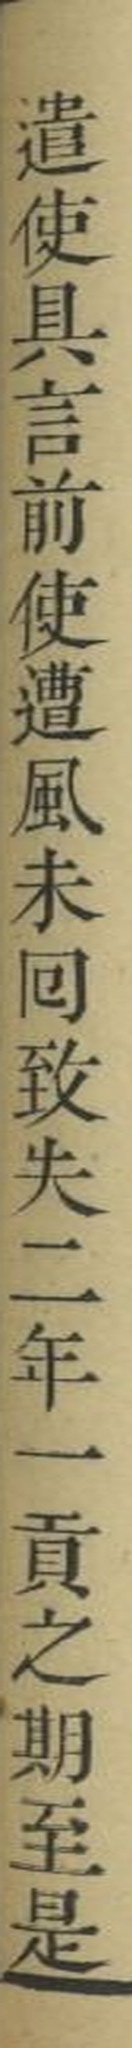遣使具言前使遭風未回致失二年一貢之期至是
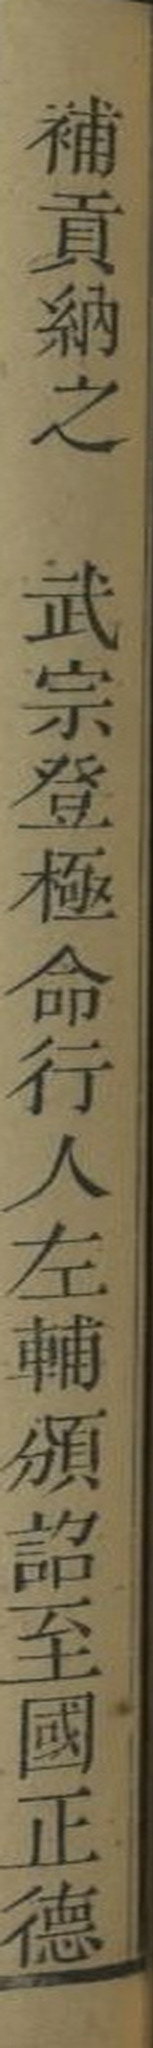補貢納之武宗登極命行人左輔頒詔至国正徳
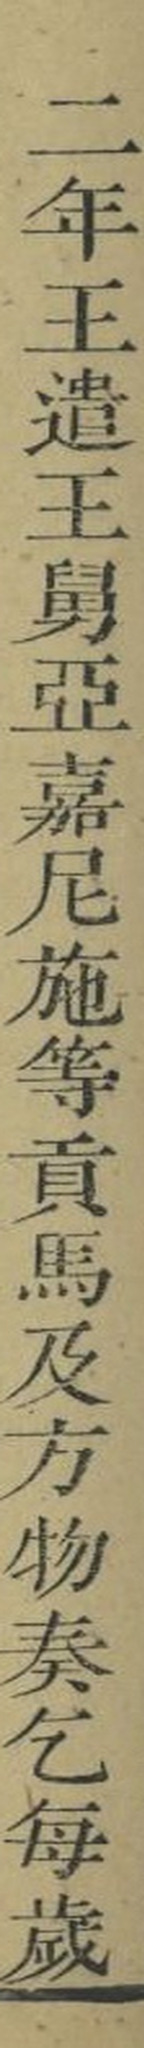二年王遣王舅亜嘉尼施等貢馬及方物奏乞毎歳
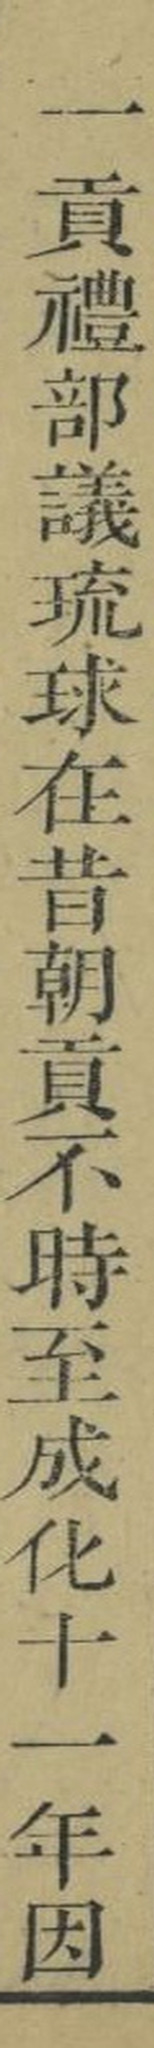一貢礼部議琉球在昔朝貢不時至成化十一年因
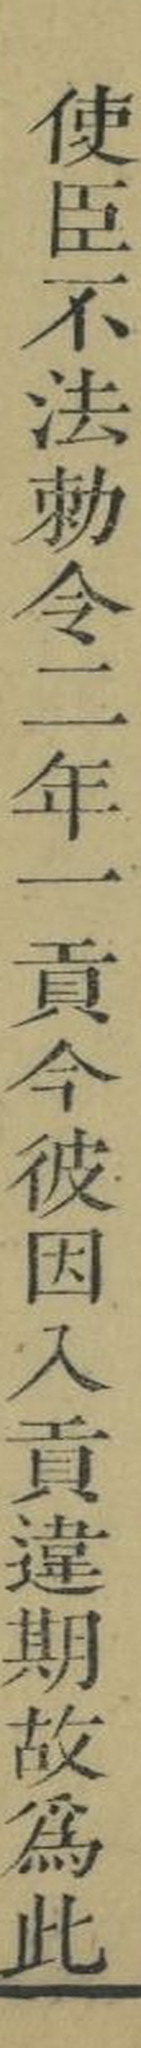使臣不法勅令二年一貢今彼因入貢違期故為此
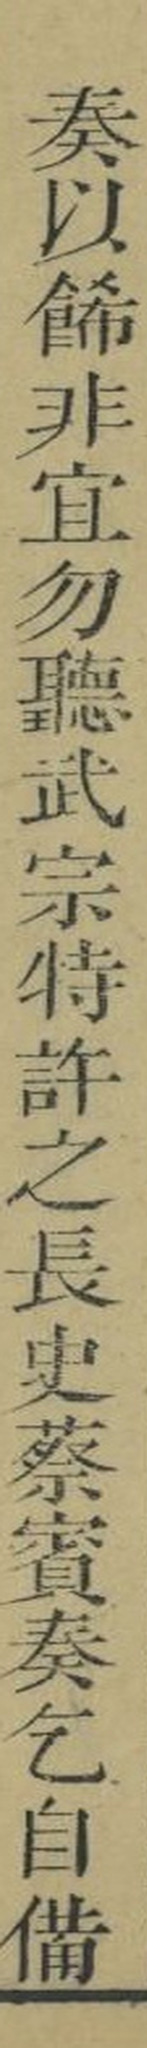奏以飾非宜勿聴武宗特許之長史蔡賓奏乞自備
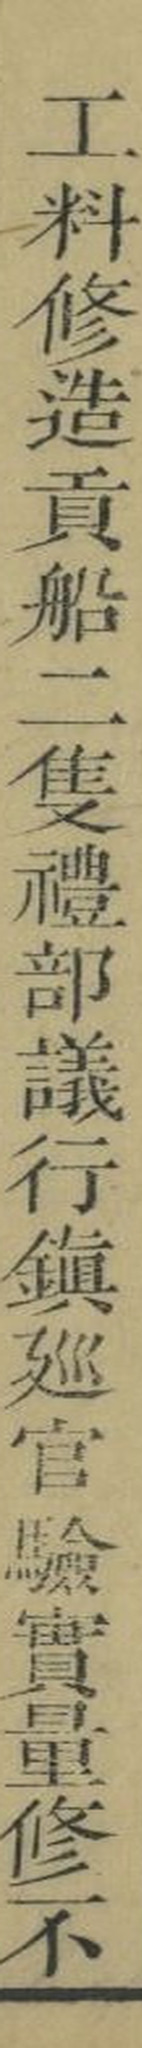工料修造貢船二隻礼部議行鎮巡官験実量修不
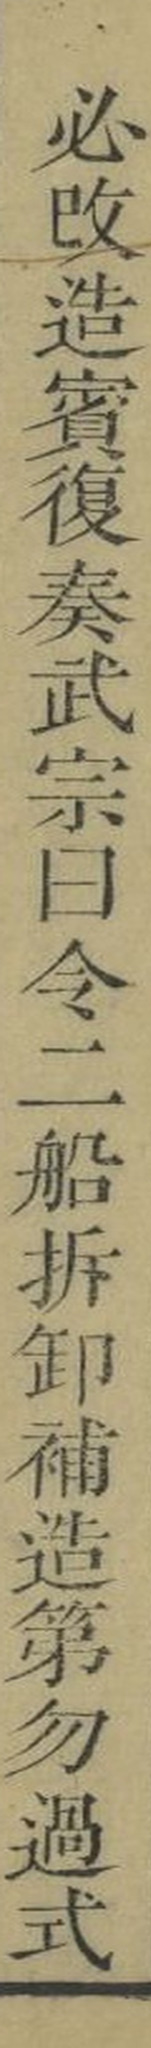必改造賓復奏武宗曰令二船拆卸補造第勿過式
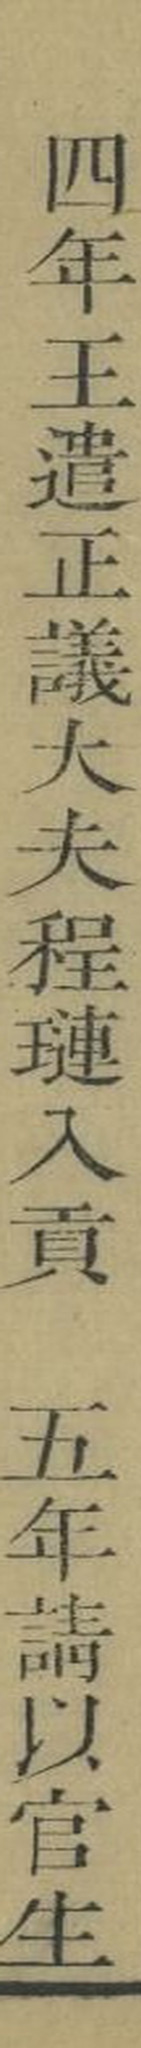四年王遣正議大夫程璉入貢五年請以官生
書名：中山伝信録 巻三
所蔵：University of the Ryukyus Library
